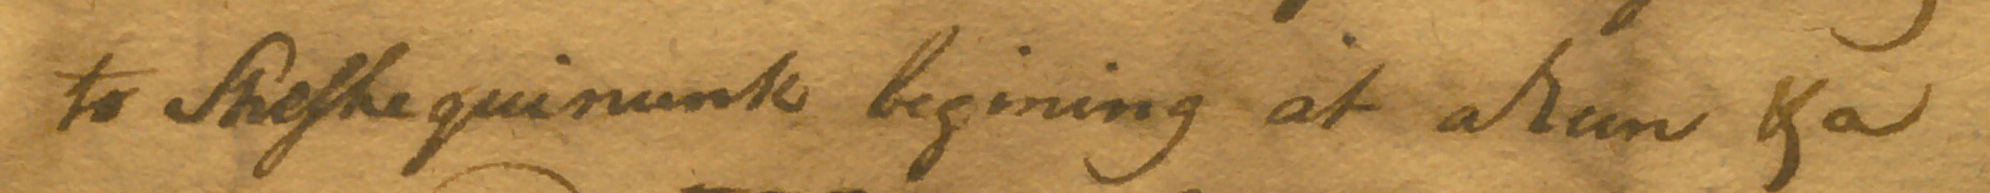to Sheshequinunk beginning at a run & a
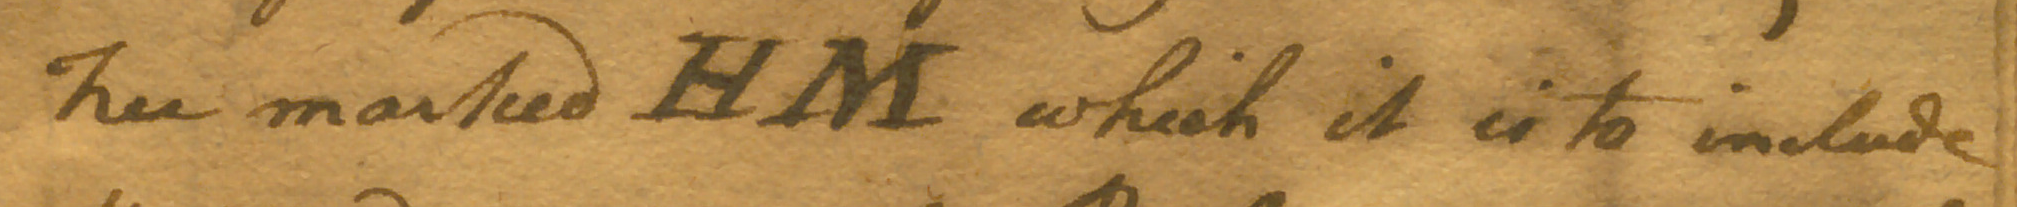Tree marked HM which it is to include
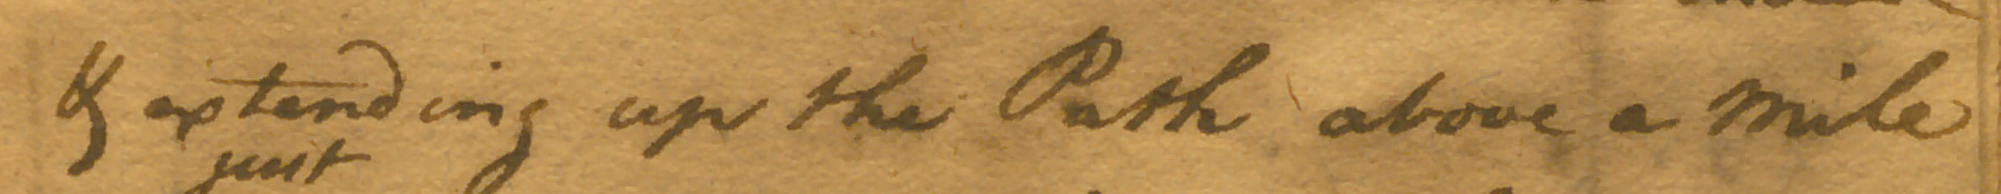& extending up the Path above a mile
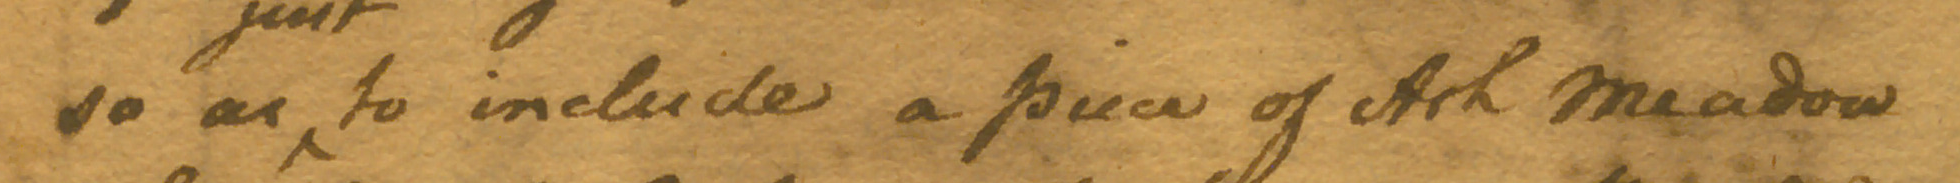so as ^ to include a piece of Ash meadow
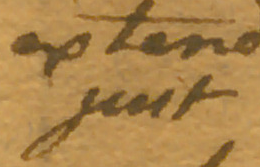just
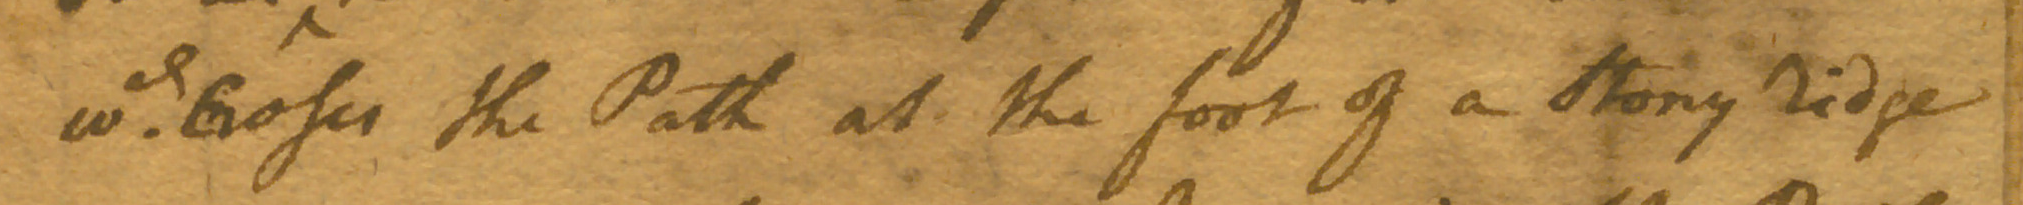w^ch Crosses the Path at the foot of a Stony ridge
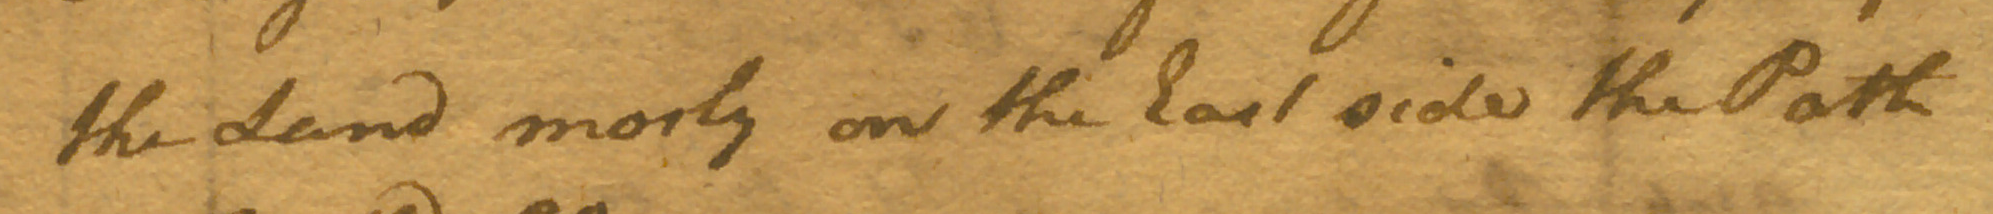the Land mosly on the East side the Path
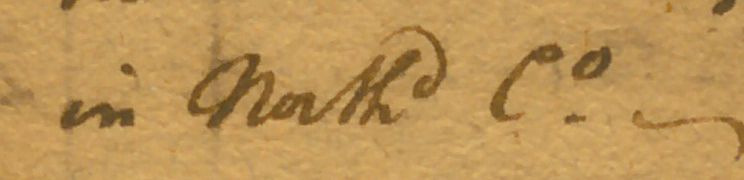in North^d C^o.-
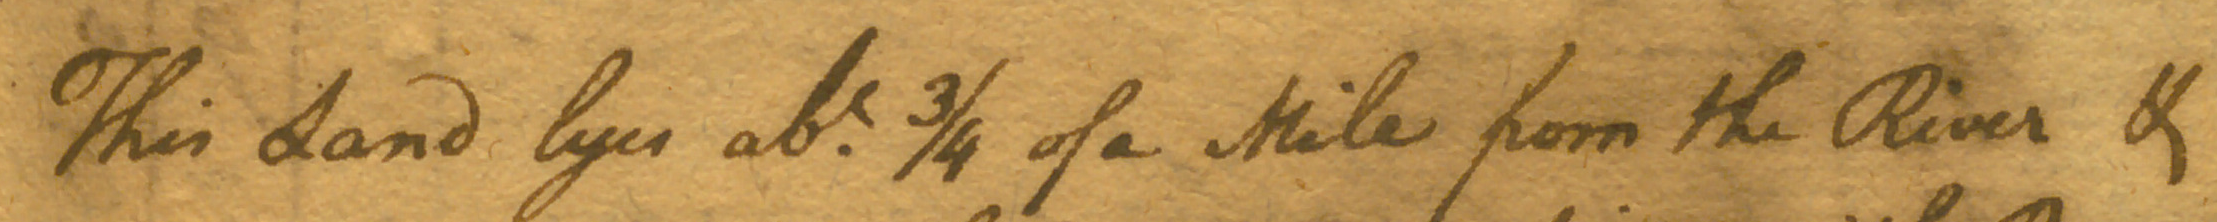This Land lyes ab^t. 3/4 of a Mile from the River &
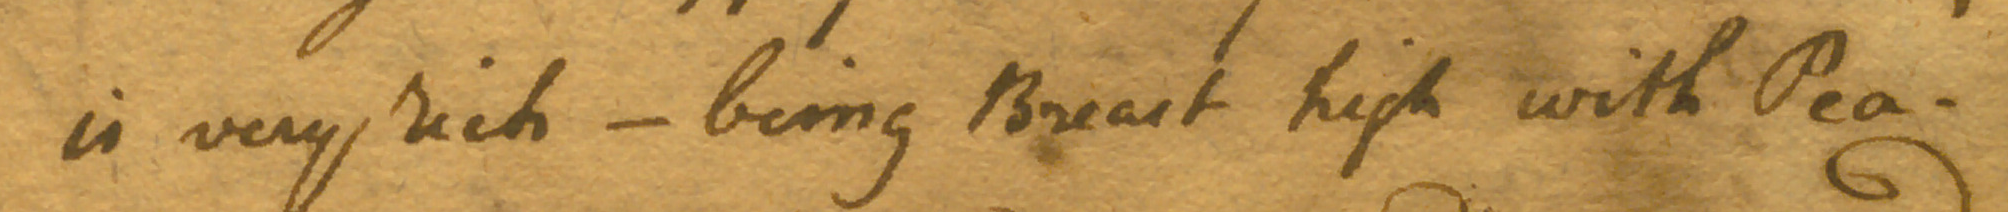is very rich-being Breast high with Pea-
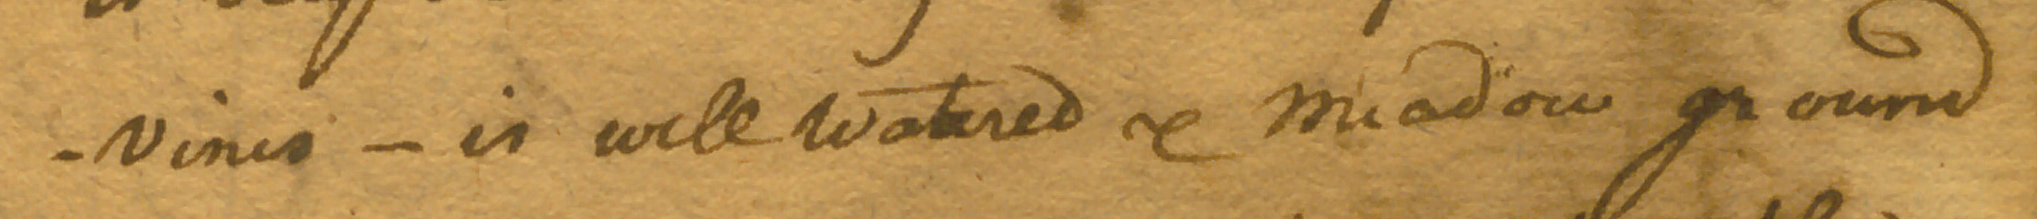-vines-is well watered & meadow ground
